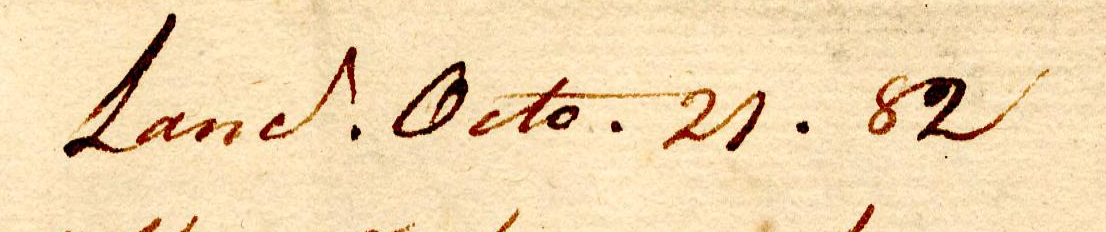Lanc^r. Octo. 21. 82
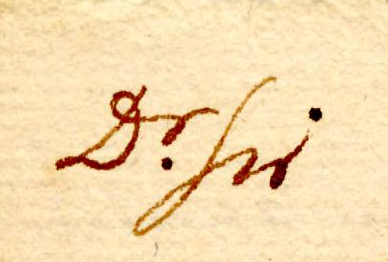D^r Sir
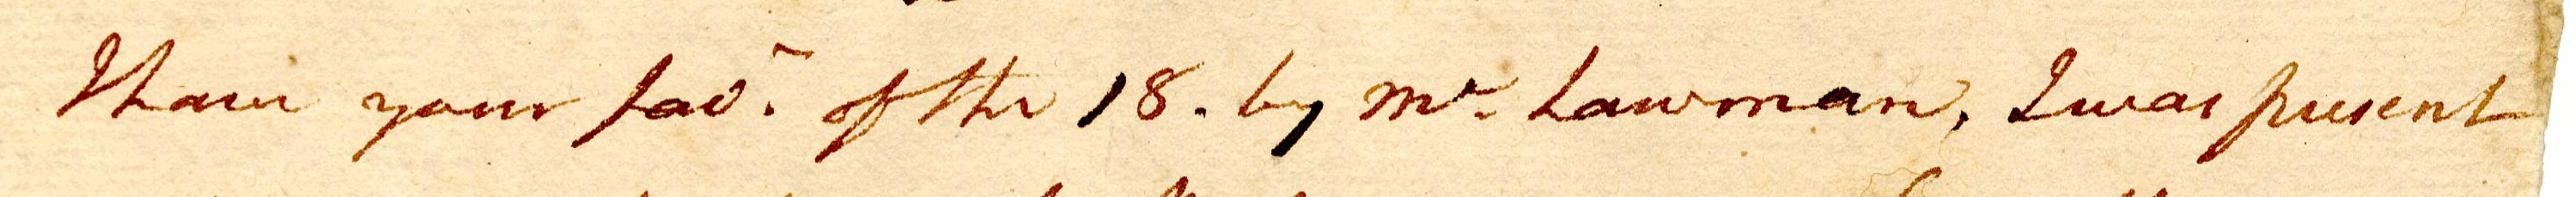I have your fav^r. of the 18. by M^r. Lawman, I was present
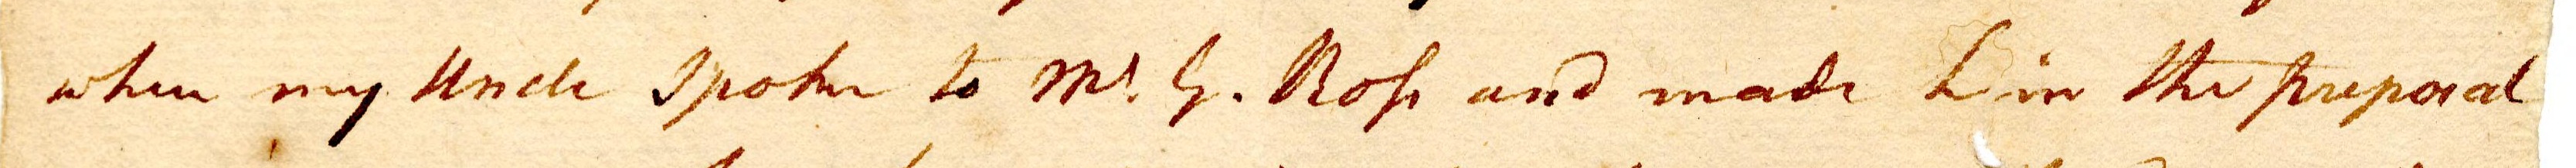when my Uncle spoke to M^r. G. Ross and made him the proposal
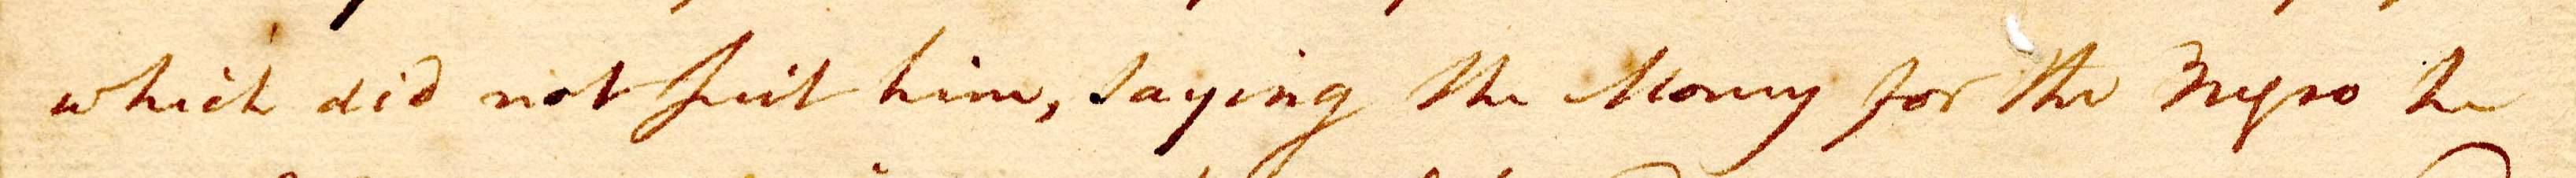which did not suit him, saying the Money for the nyrs he
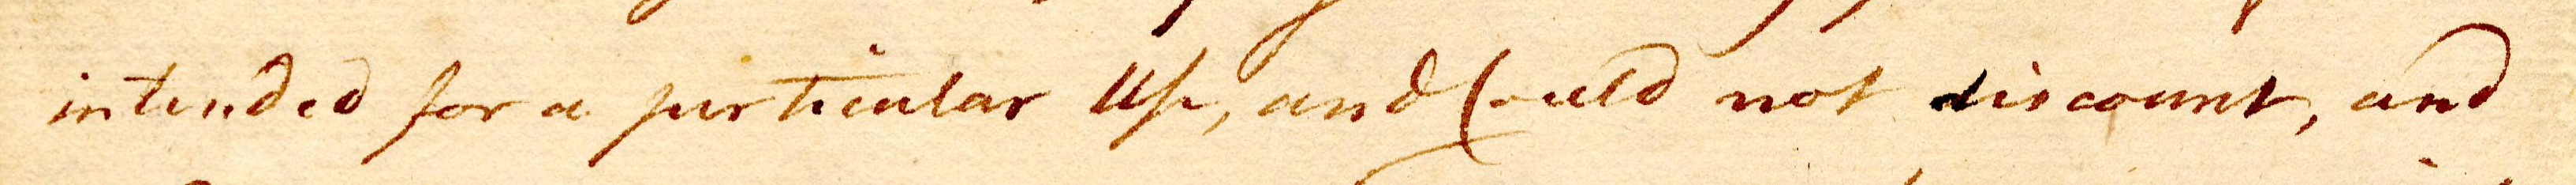intended for a particular use, and Could not discount, and
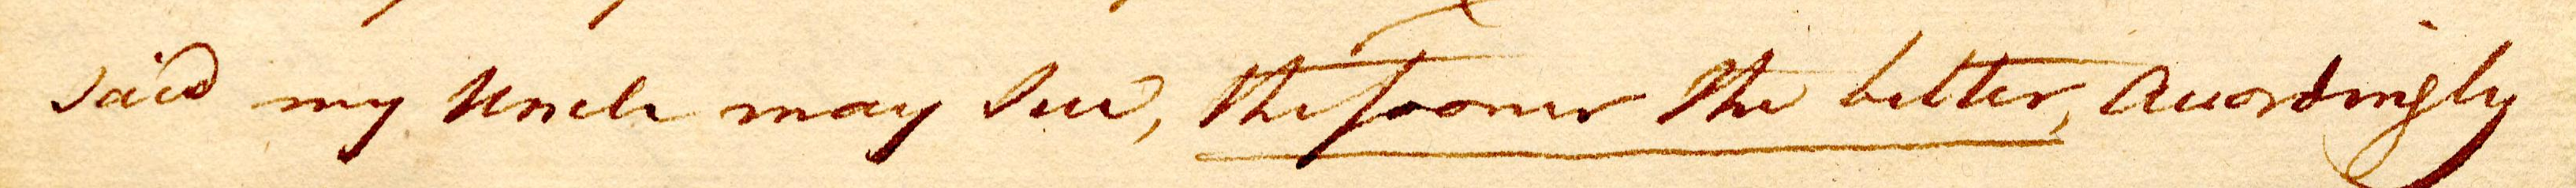said my Uncle may sue, the sooner the better, Accordingly
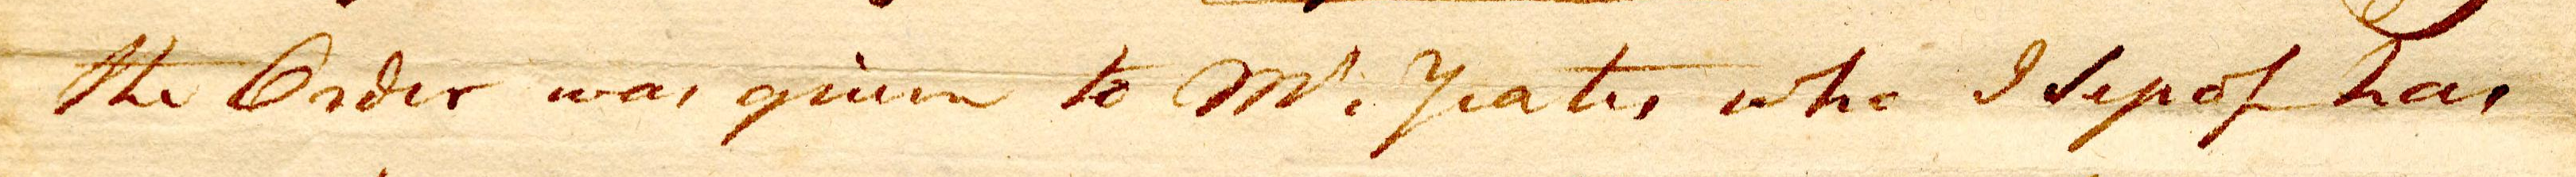the Order was given to M^r. Yeates who I supose has
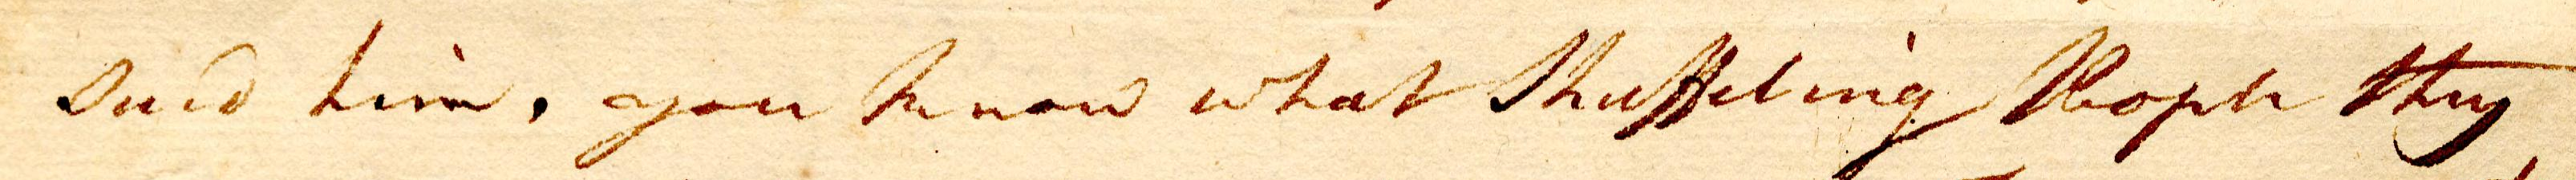sued him, you know what Shuffeling People they
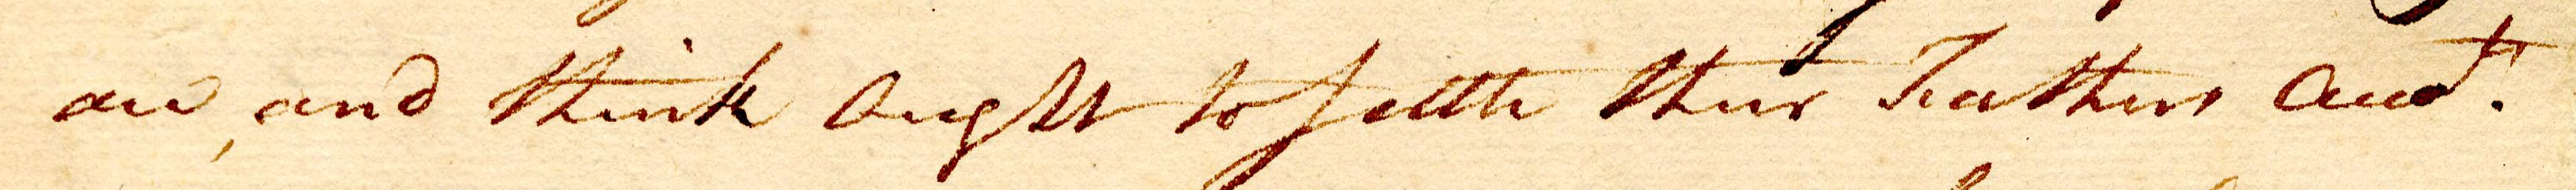are, and think ought to settle their Fathers Acco^t.
